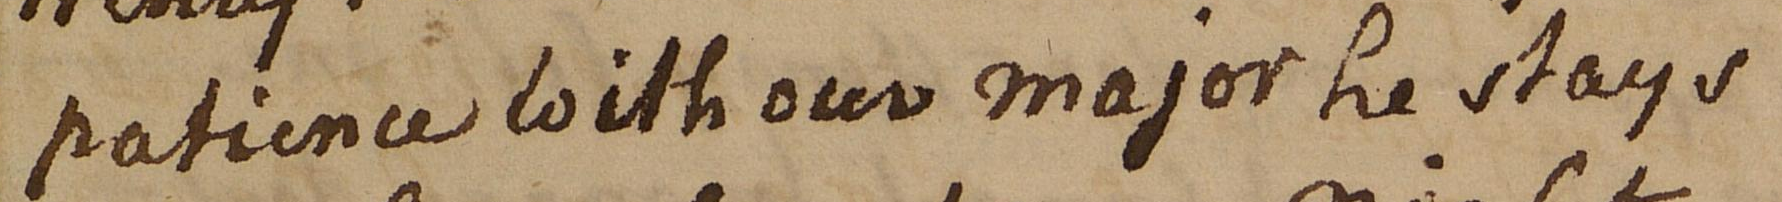patience with our major he stays
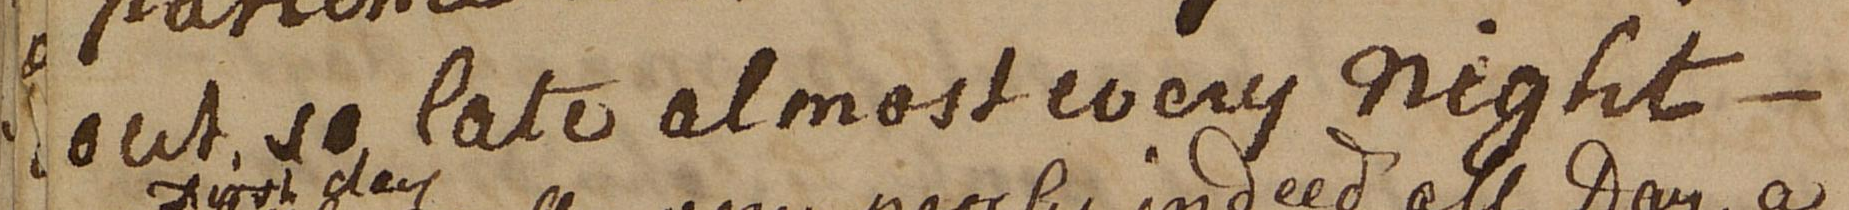out, so late almost every night-
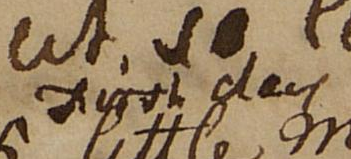First day
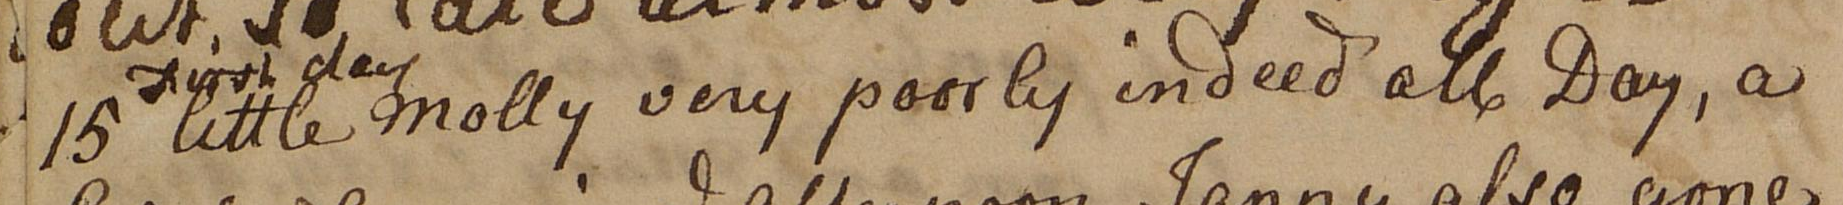15 little Molly very poorly indeed all Day, a
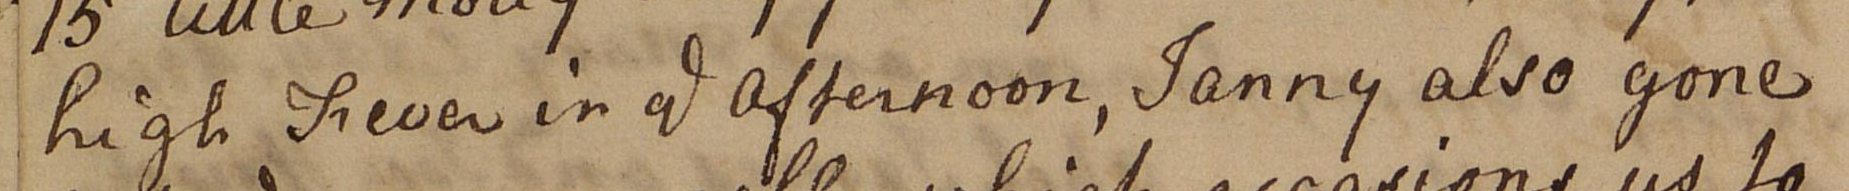high Fever in y^e afternoon, Janny also gone
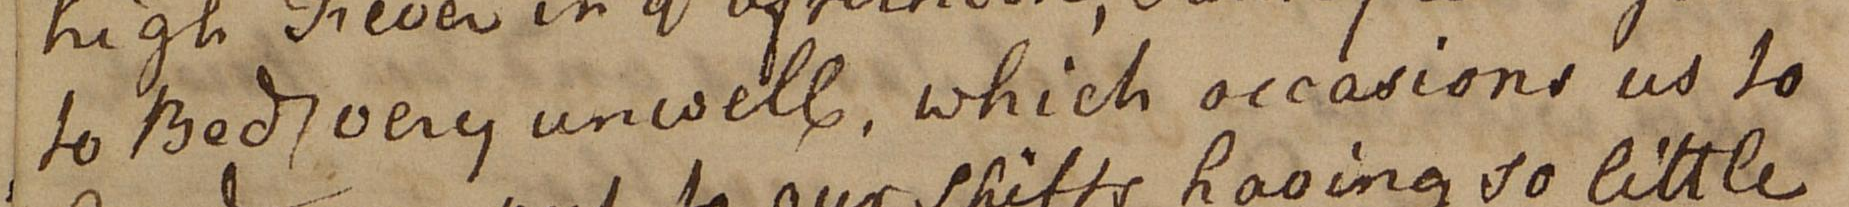to Bed very unwell, which occasions us to
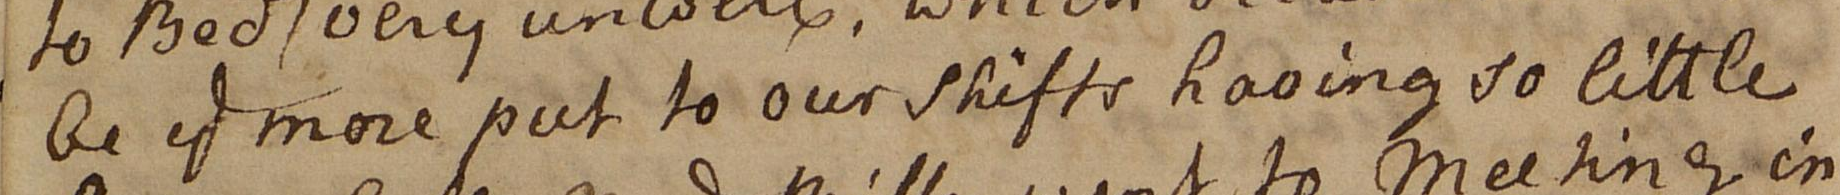be y^e more put to our shifts having so little
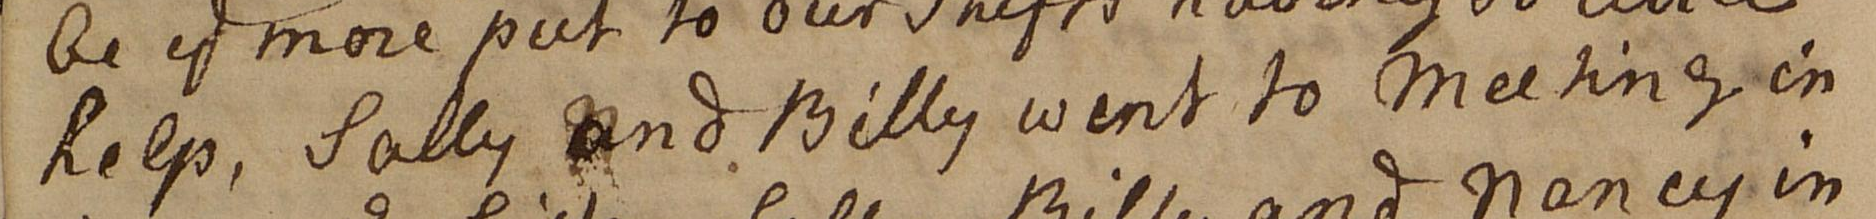help, Sally and Billy went to Meeting in
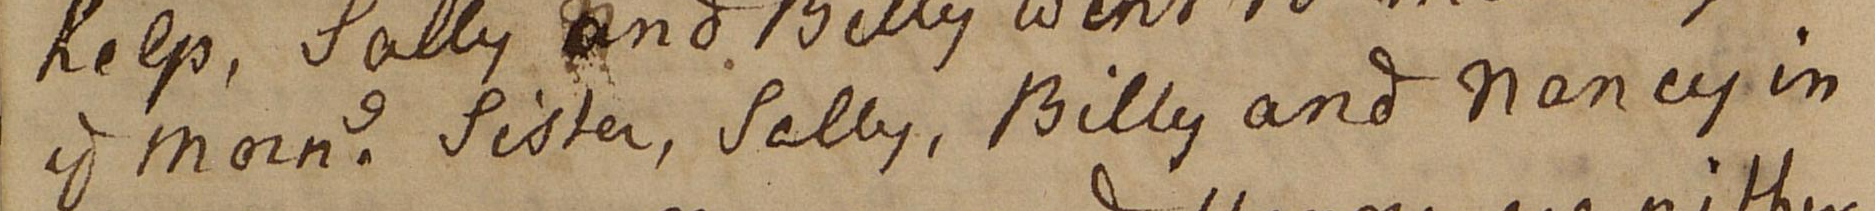y^e Morn^g. Sister, Sally, Billy and Nancy in
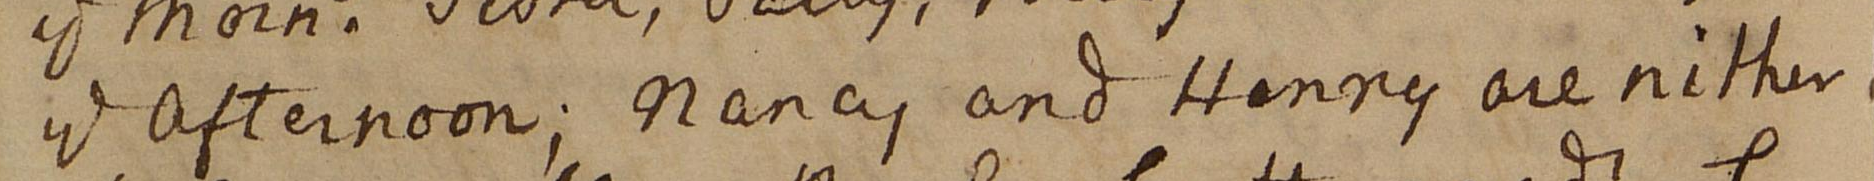y^e Afternoon, Nancy and Henry are nither
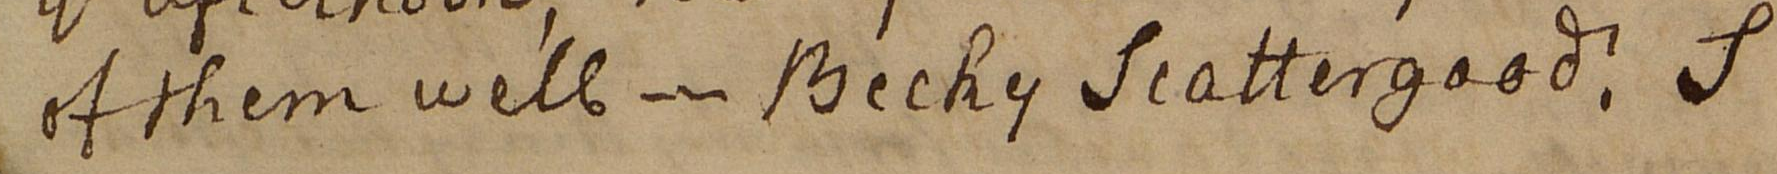of them well- Becky Scattergood. S
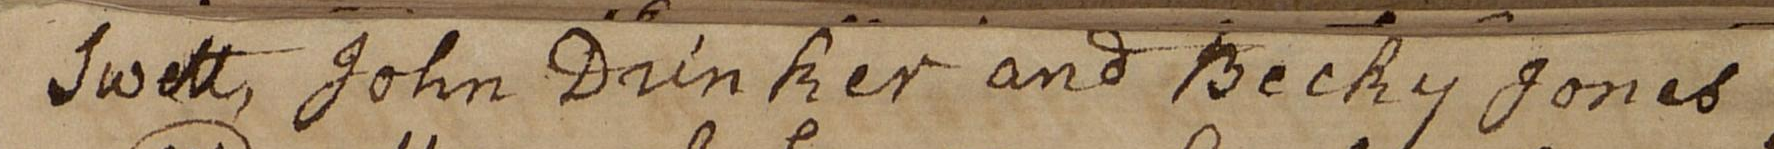Swett, John Drinker and Becky Jones
